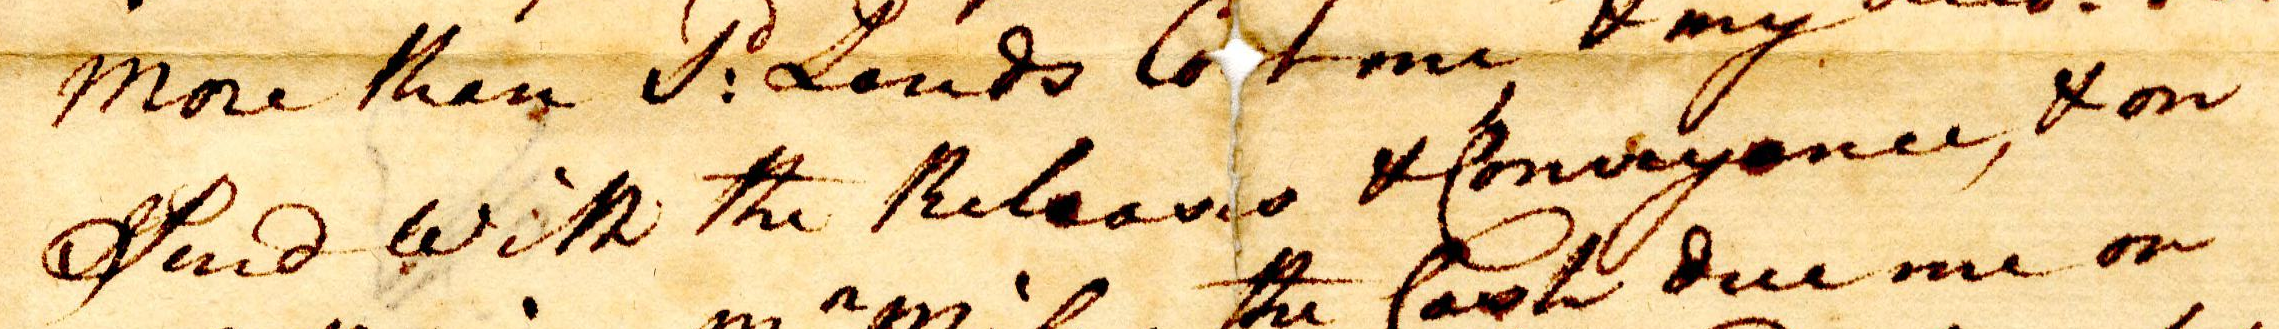send with the Releases & Conveyance, & on
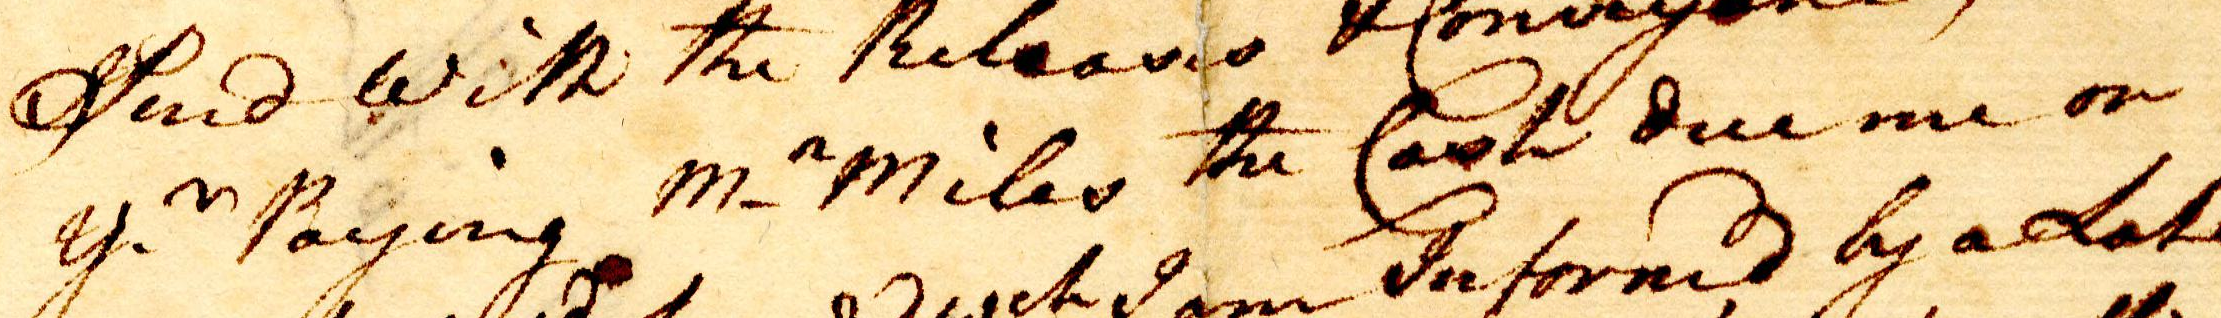y^r. Paying M^r. Miles the Cash due me on
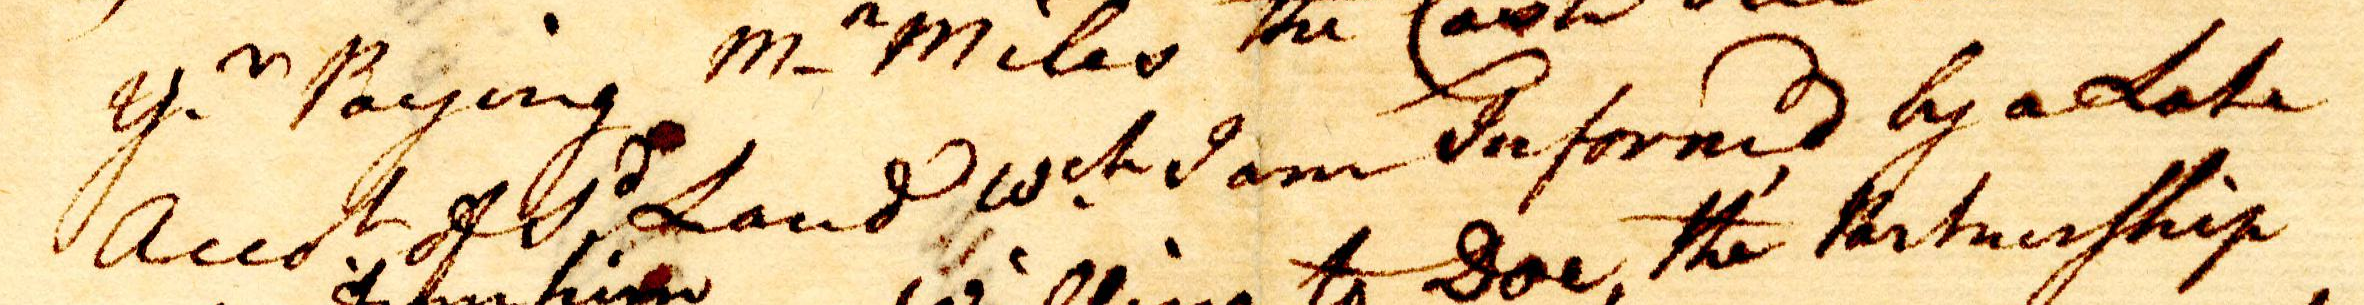Acco^t. of s^d. Land w^ch. I am Informd by a Late
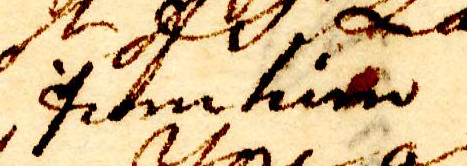from him
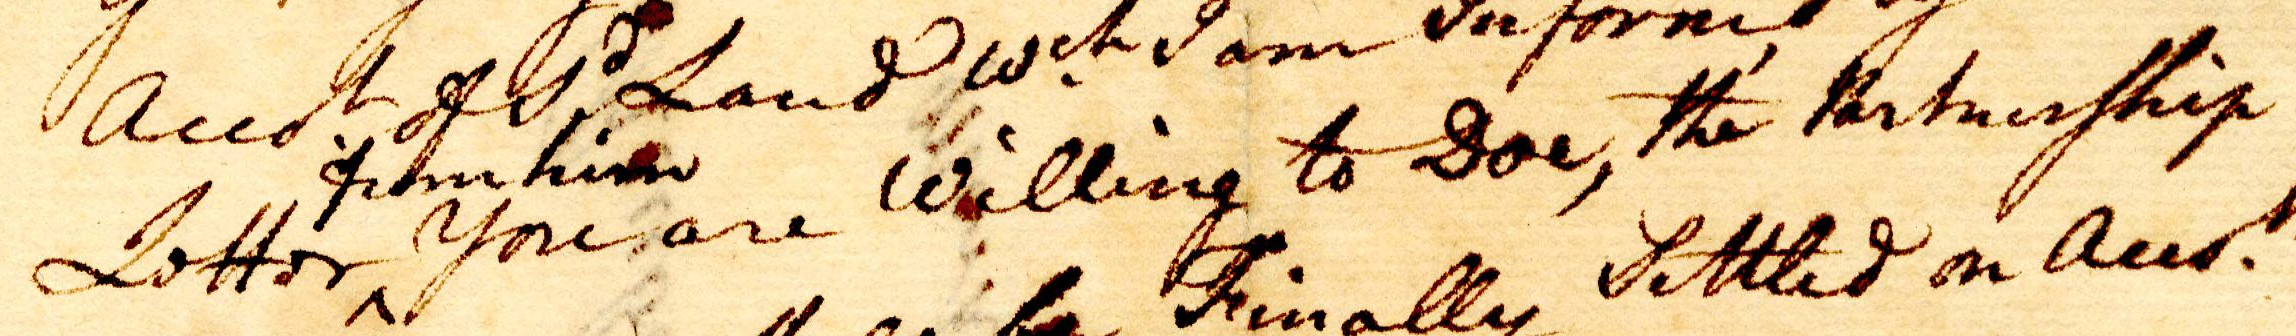Letter ^ you rae willing to Doe, the Partnership
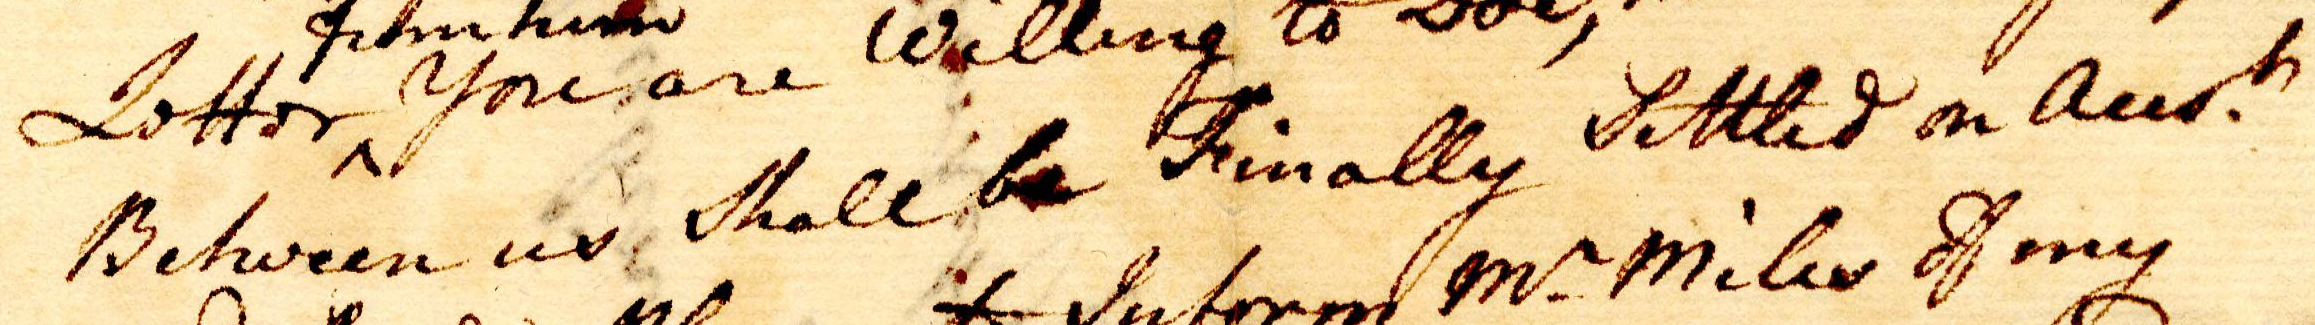Between us shall be Finally settled on Acco^t.
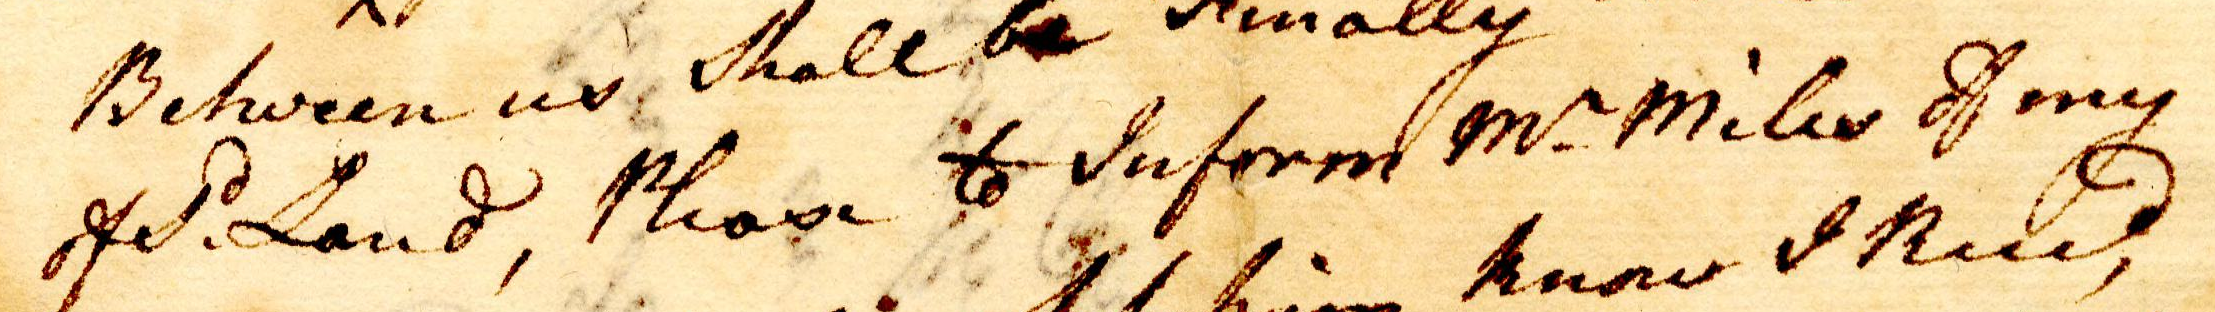of s^d. Land, Please to Inform M^r. Miles of my
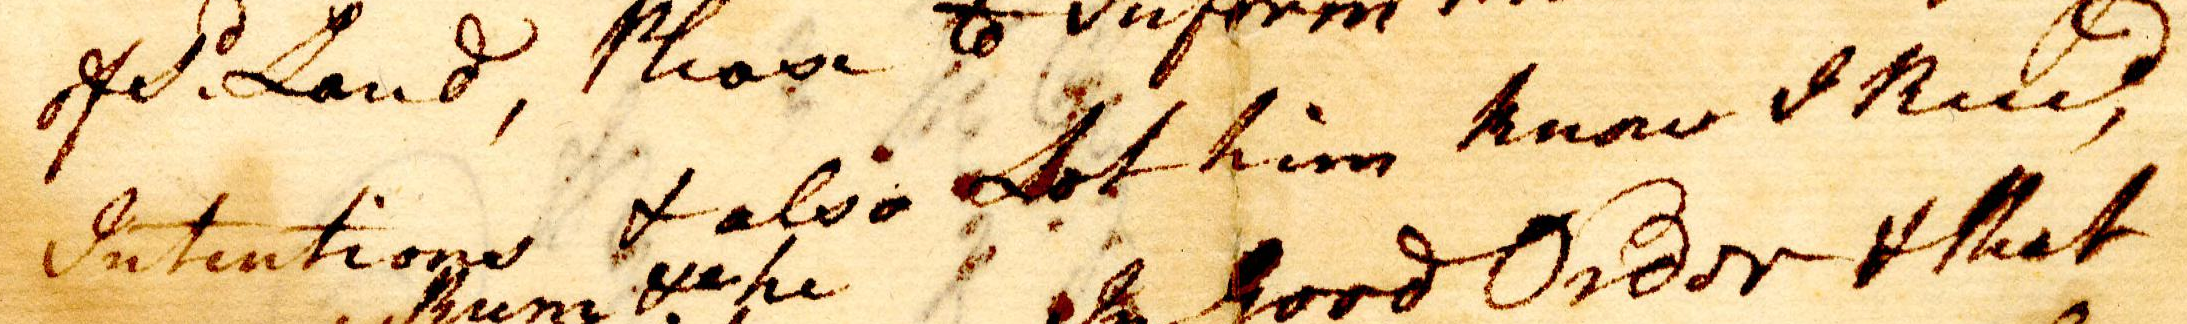Intentions & also Let him know I Rece^d
